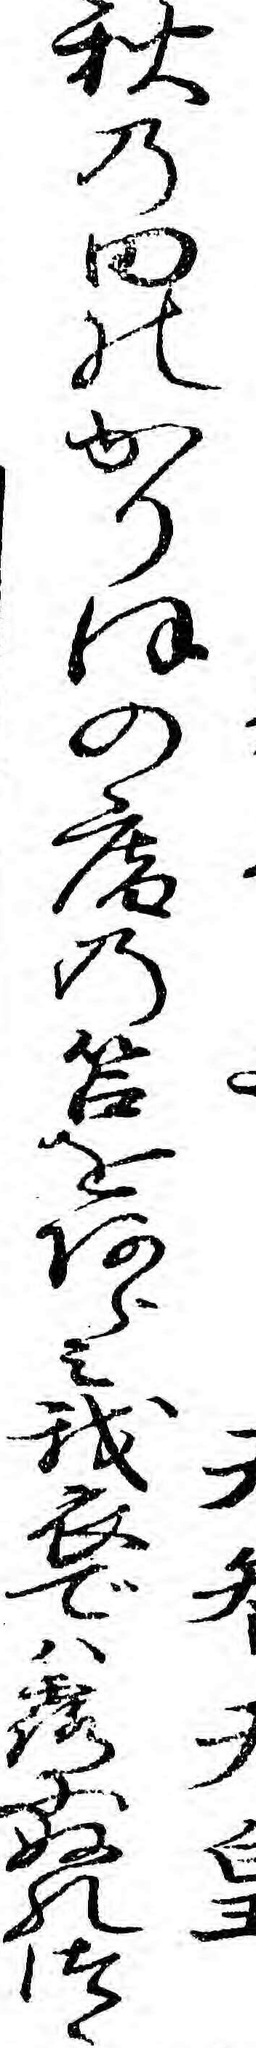秋の田のかりほの廬の苫をあらみ我衣では露にぬれつゝ
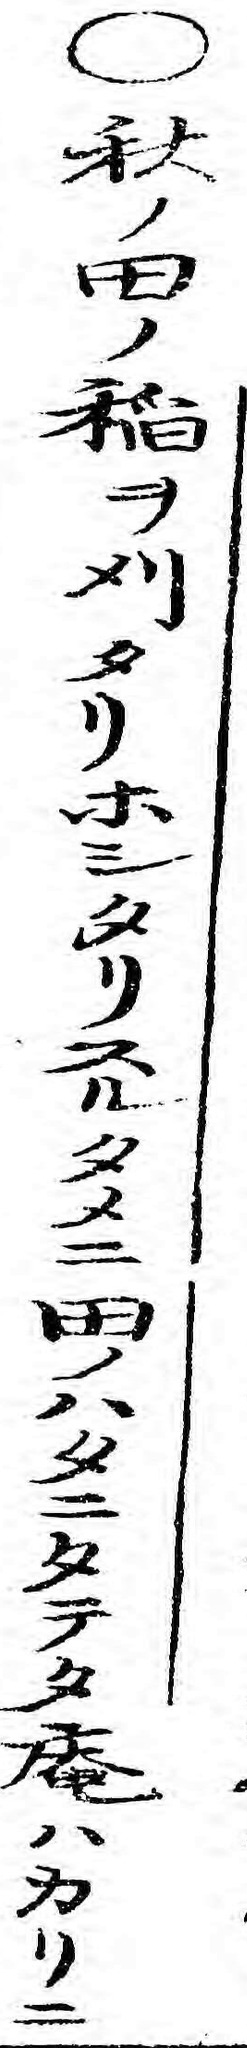○秋ノ田ノ稲ヲ刈タリホシタリスルタメニ田ノハタニタテタ庵ハカリニ
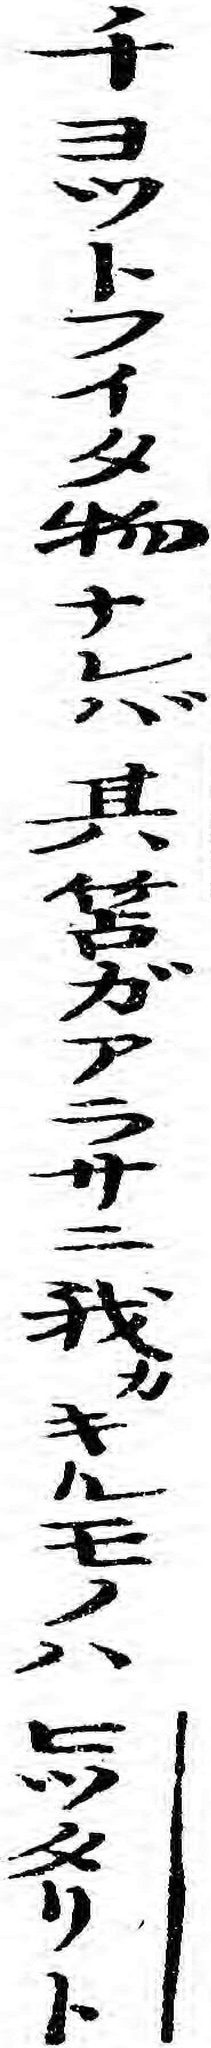チヨツトフイタ物ナレバ其苫ガアラサニ我キルモノハヒツタリト
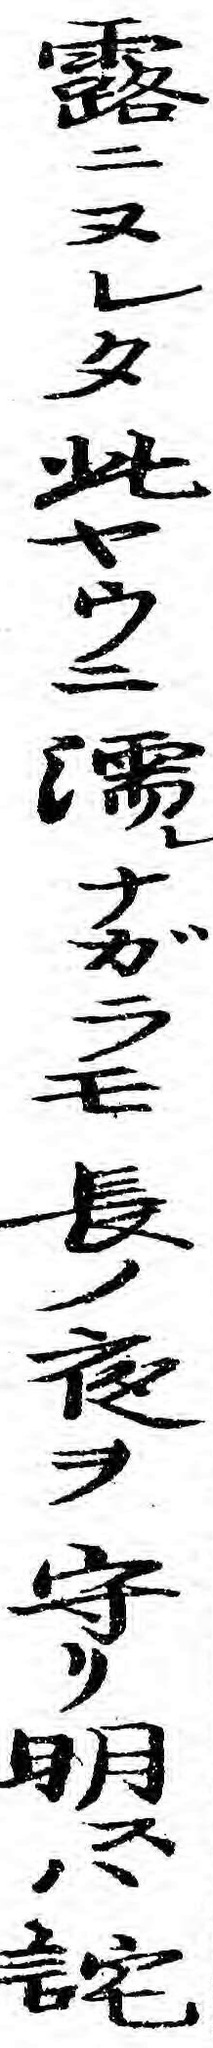露ニヌレタ此ヤウニ濡ナガラモ長ノ夜ヲ守リ明ハ詫
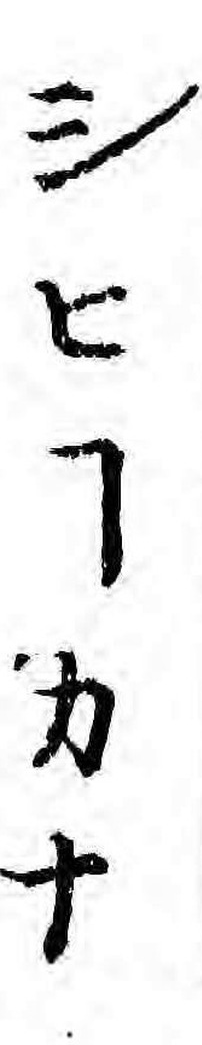シヒコトカナ
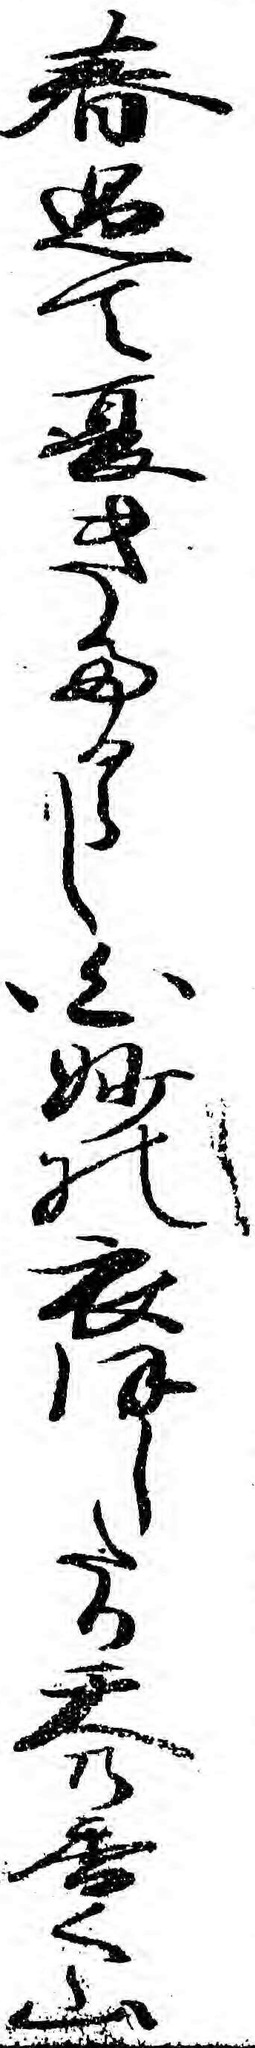春過て夏きたるらし白妙の衣ほしたり天の香く山
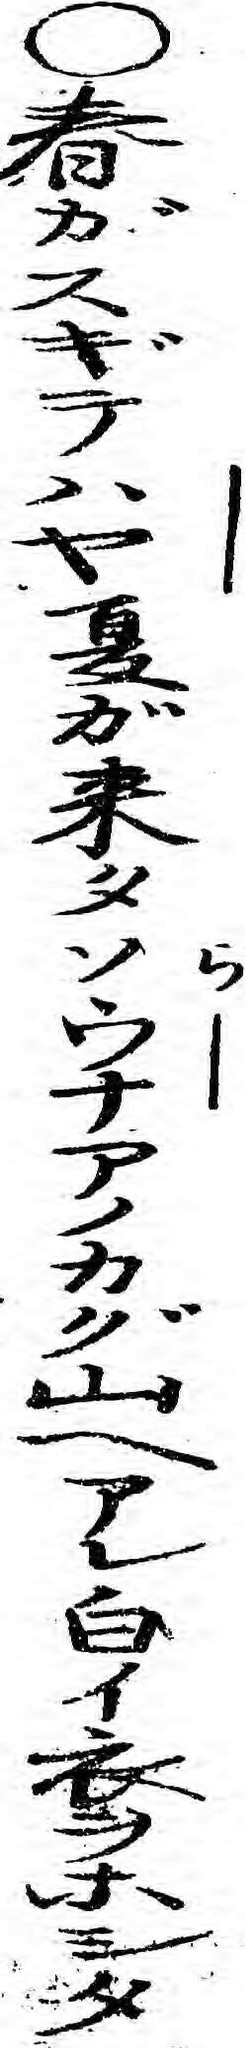○春ガスギテハヤ夏ガ来タソウナアノカグ山ヘアレ白イ衣ヲホシタ

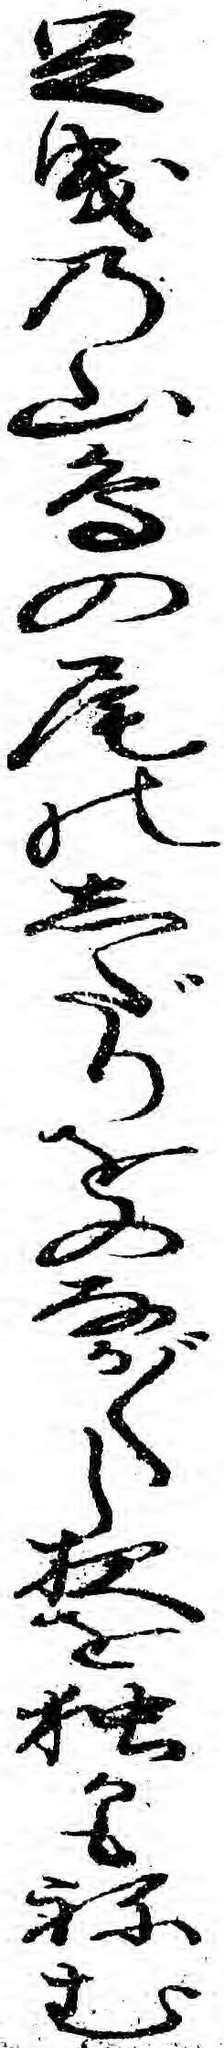足曳乃山鳥の尾のしだりをのなが〳〵し夜を独かもねむ
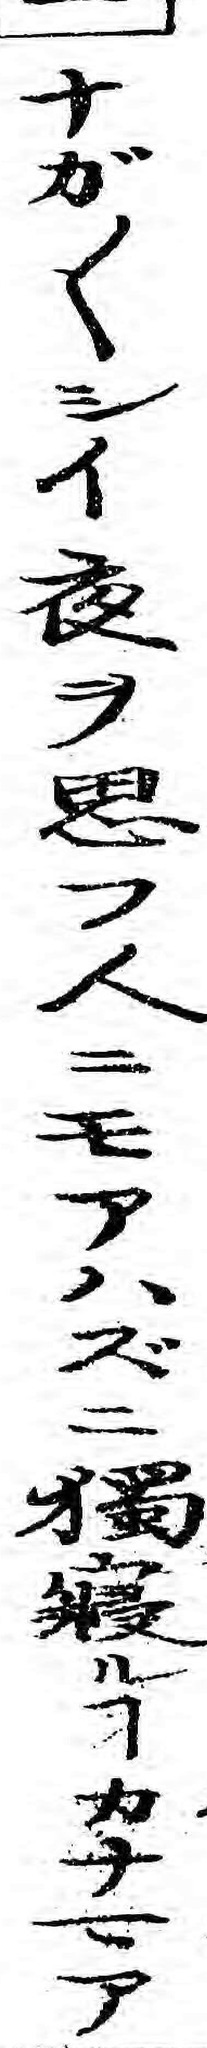○上ナガ〳〵シイ夜ヲ思フ人ニモアハズニ独寝ルコトカナマア
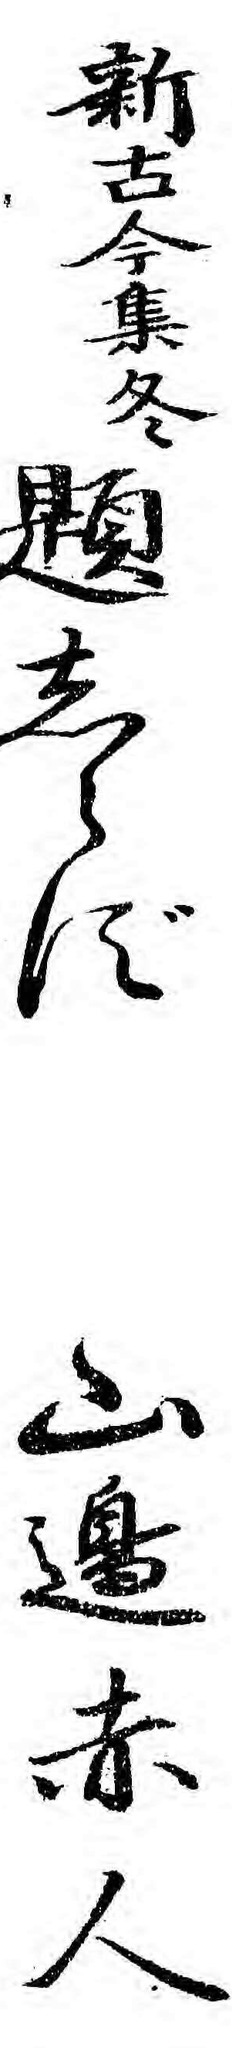新古今集冬題しらず山邊赤人
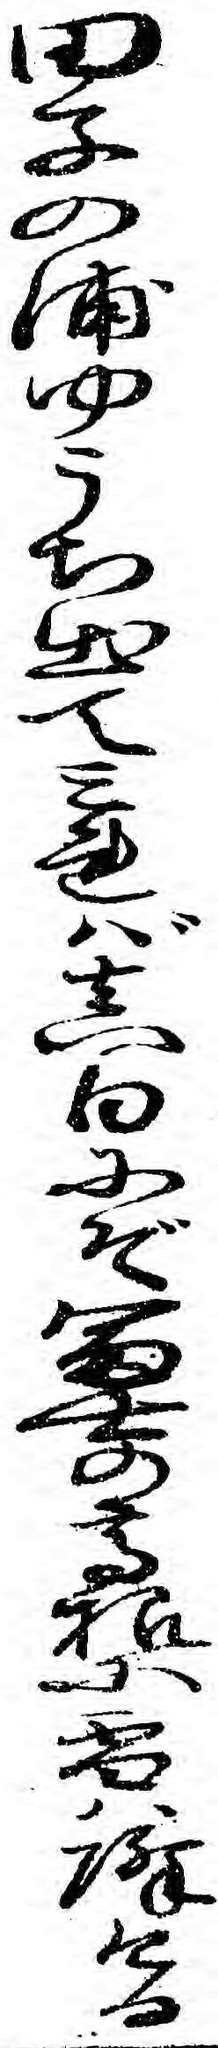田子の浦ゆうち出でてみれば真白にぞ冨士の高ねに雪は降ける
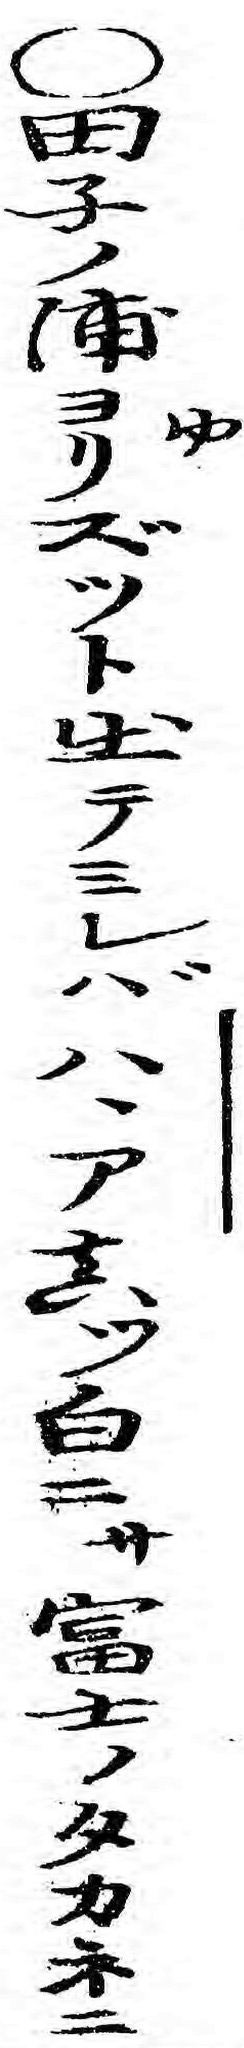○田子の浦ヨリズツト出テミレバハヽア真ッ白ニ富士ノタカネニ
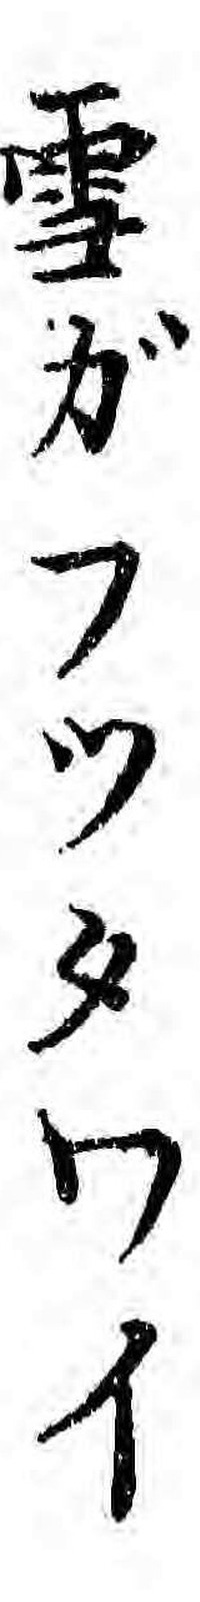雪ガフツタワイ
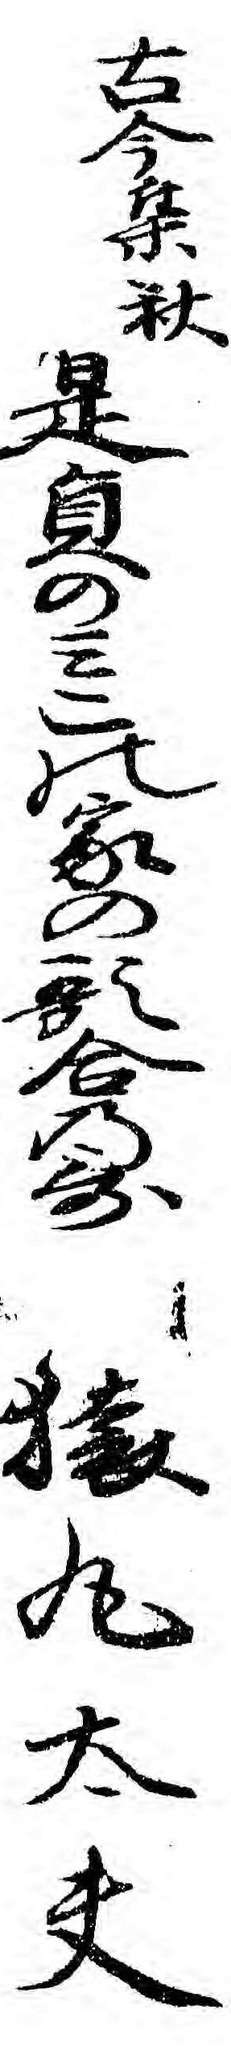古今集秋是貞のみこの家の歌合の哥猿丸大夫
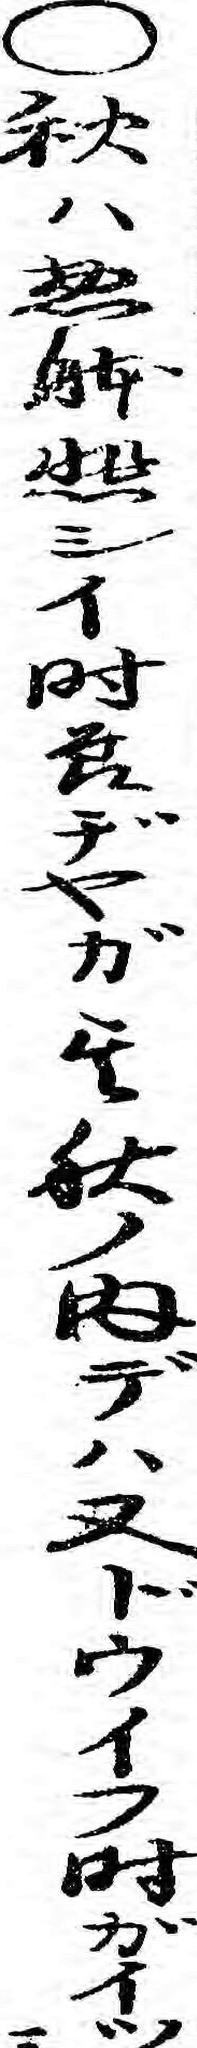○秋ハ惣体悲シイ時節ヂヤガ其秋ノ内デハ又ドウイフ時ガイツチ
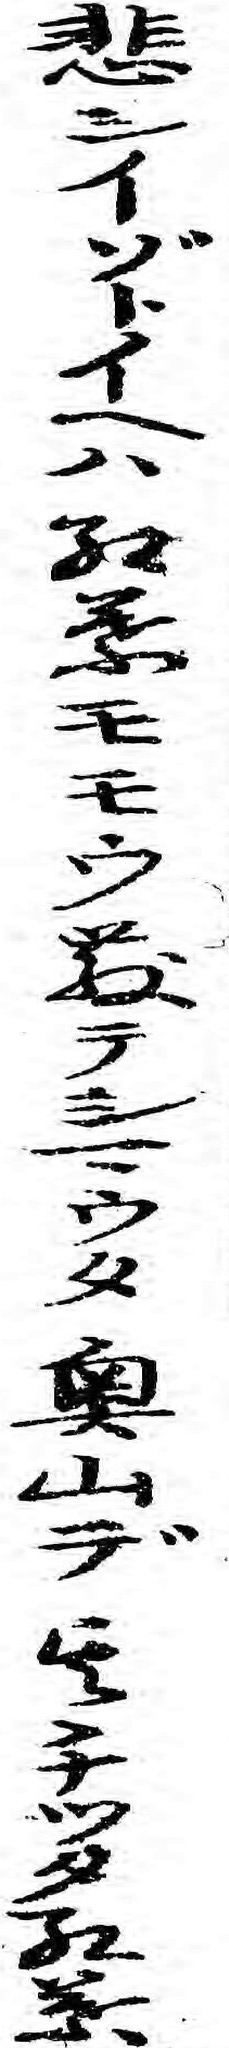悲シイゾトイヘハ紅葉モモウ散テシマウタ奥山デ其チツタ紅葉
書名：百人一首／小倉の山ふみ
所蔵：国文学研究資料館
